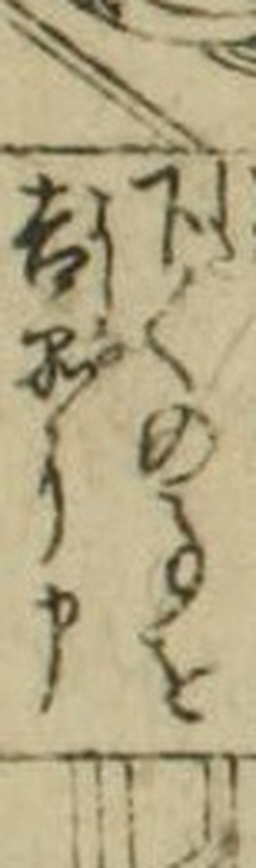吉品に申
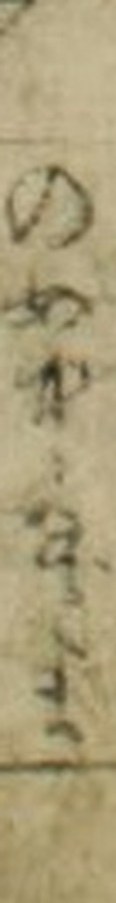の女中などま
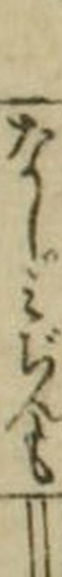なし。みぢんも
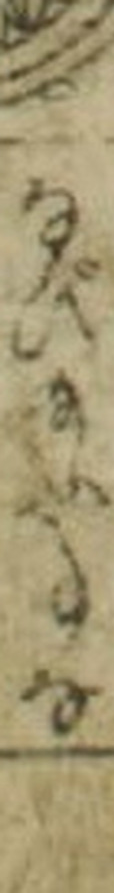なび給ふ事な
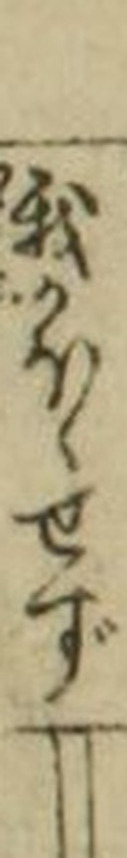我かほゝせず
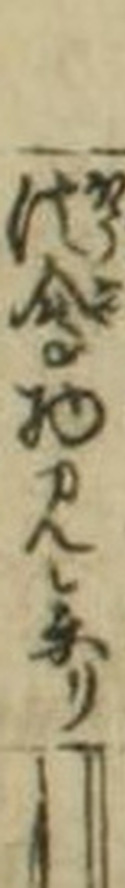法會物見参り
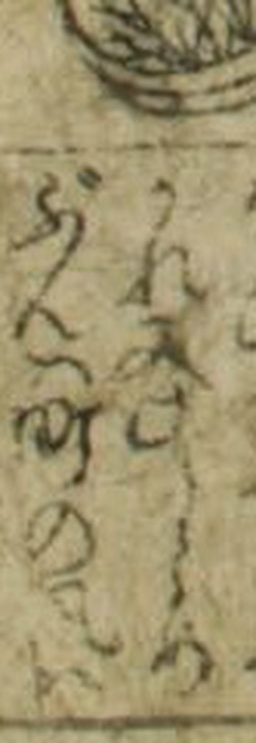ぶんへ町の
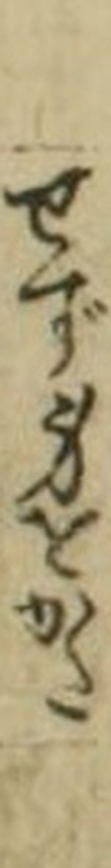せず身をかた
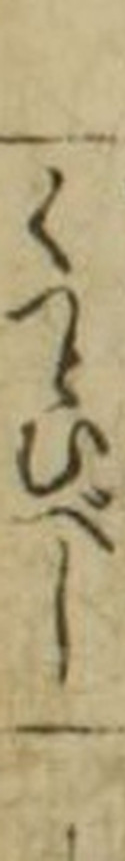くつとむべし

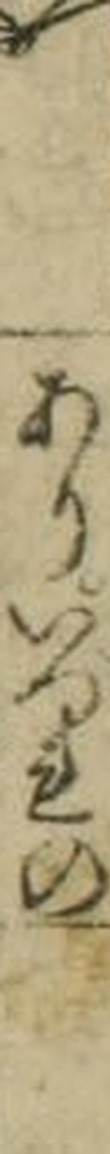あり。いづれの
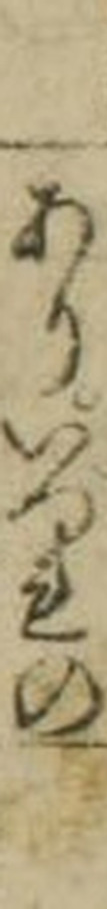あり。いづれの
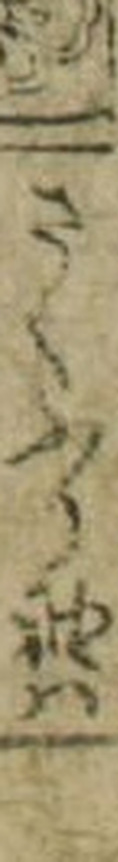さくふり袖は
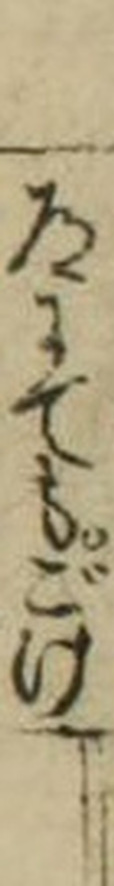道にても。ごけ
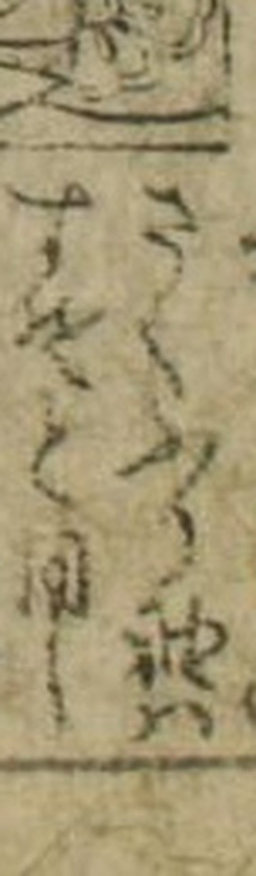すそと同じ
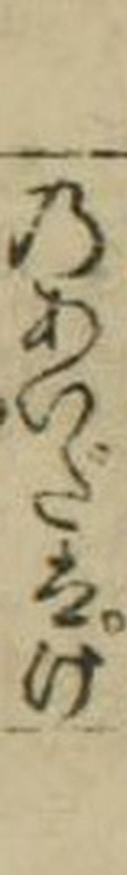のあいだは。け
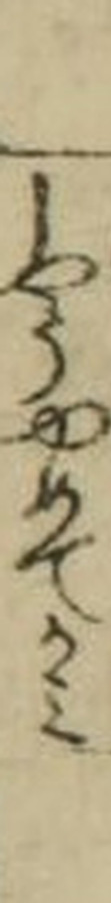しやうやめてかみ
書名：女源氏教訓鑑
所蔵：東京学芸大学附属図書館
